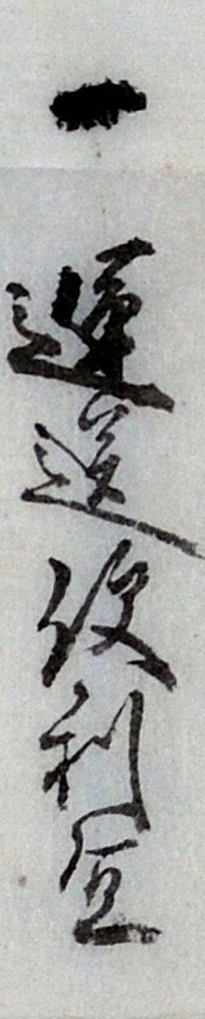一運送便利宜
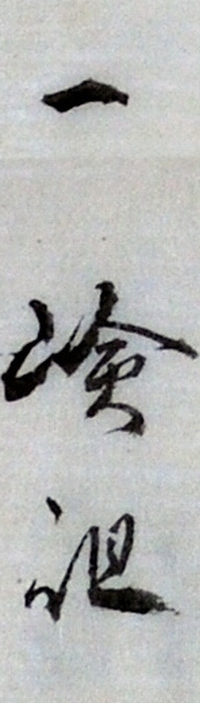一嶮岨
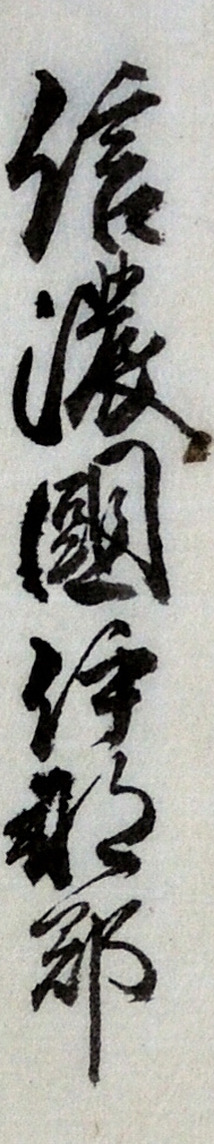信濃国伊那郡
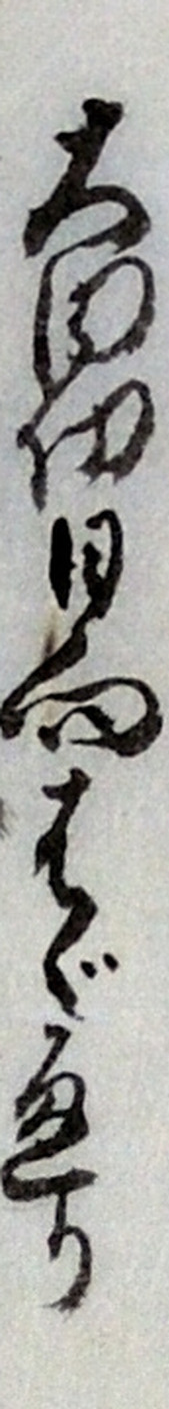大田◻︎日向はヾ通り
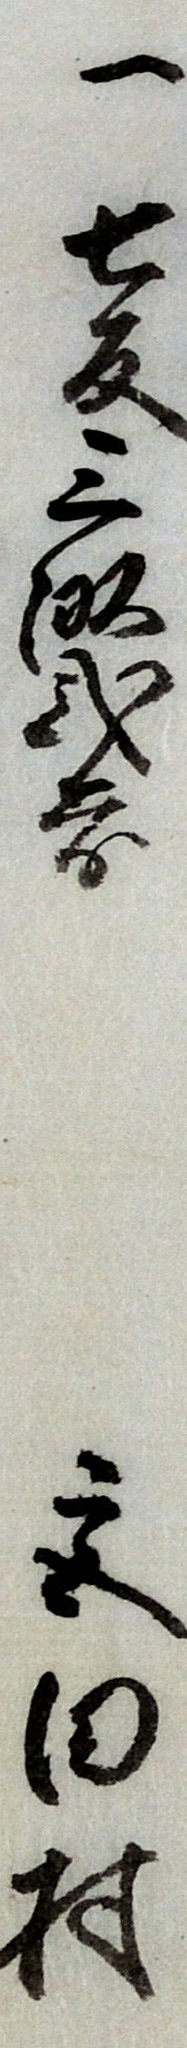一七反三㽗弐歩宮田村
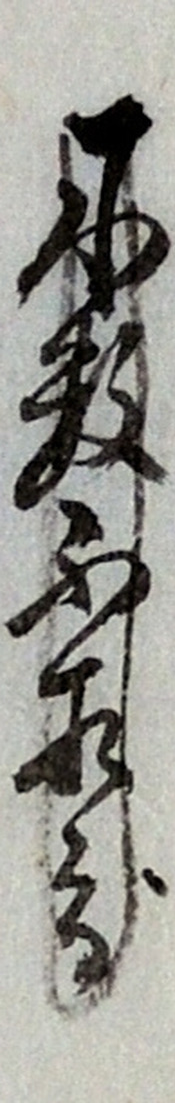木数不相分
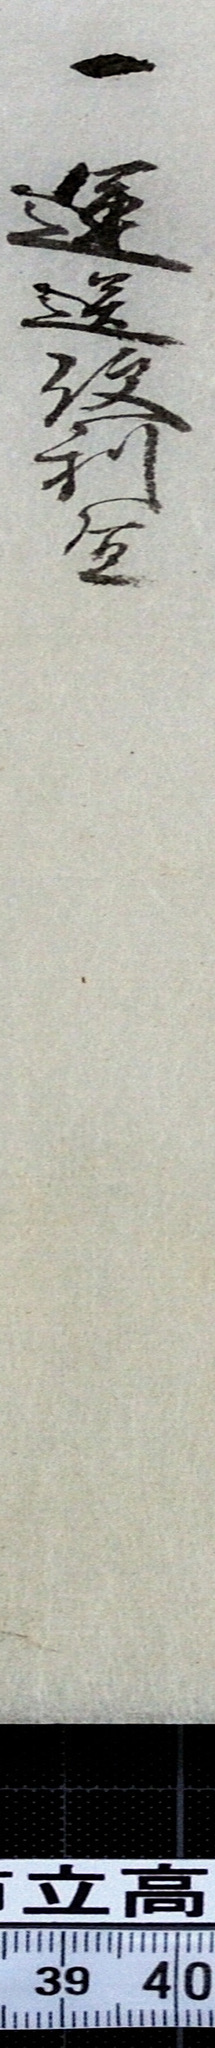一運送便利宜
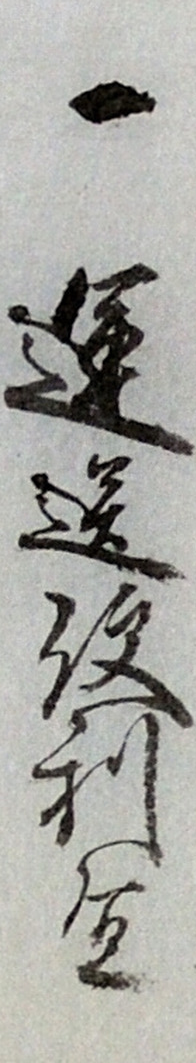一運送便利宜
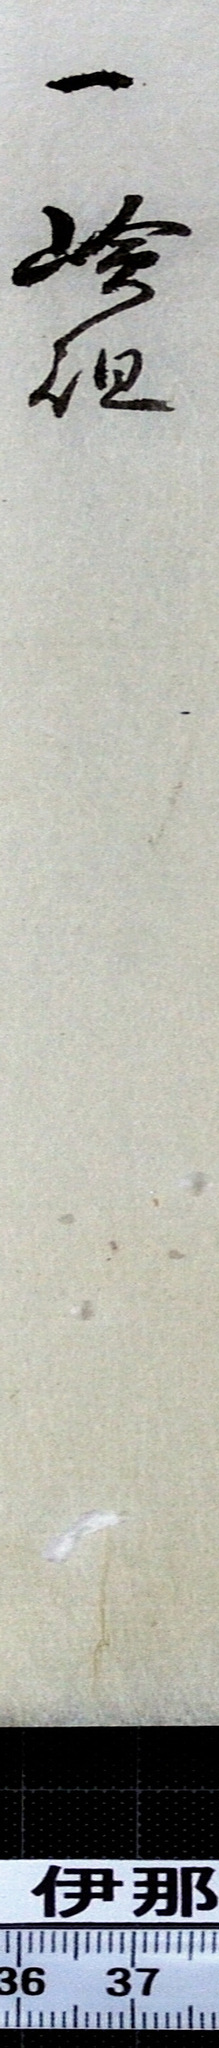一嶮岨
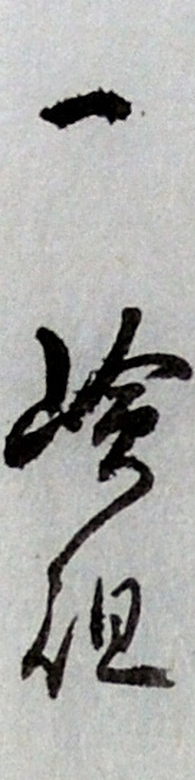一嶮岨

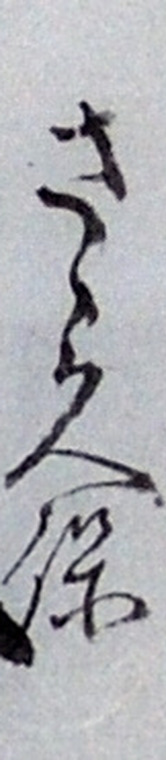さゝ久保
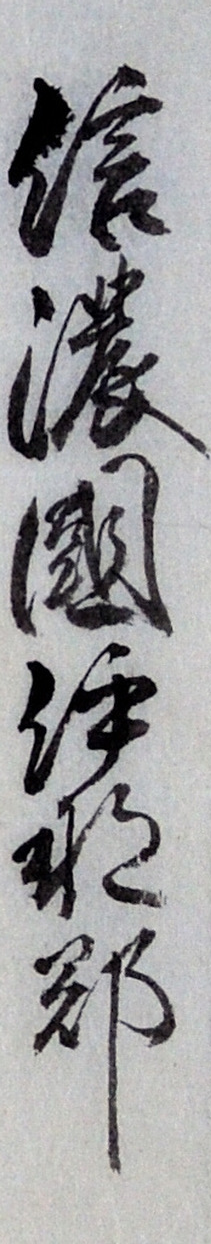信濃国伊那郡
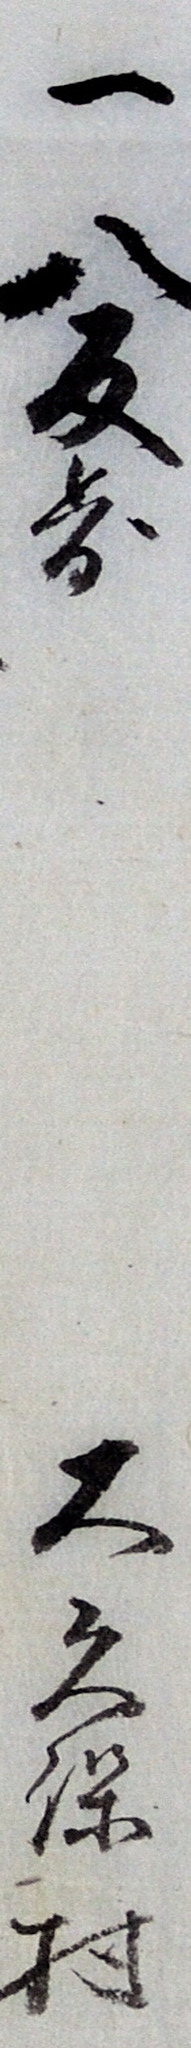一八反歩大久保村
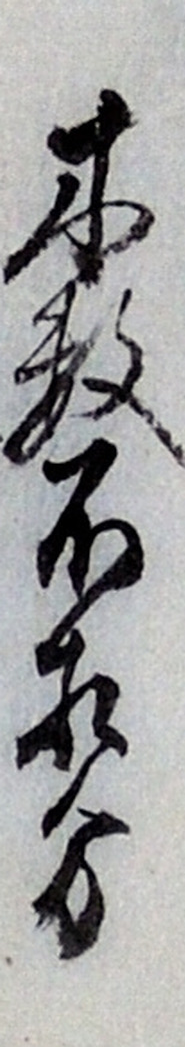木数不相分
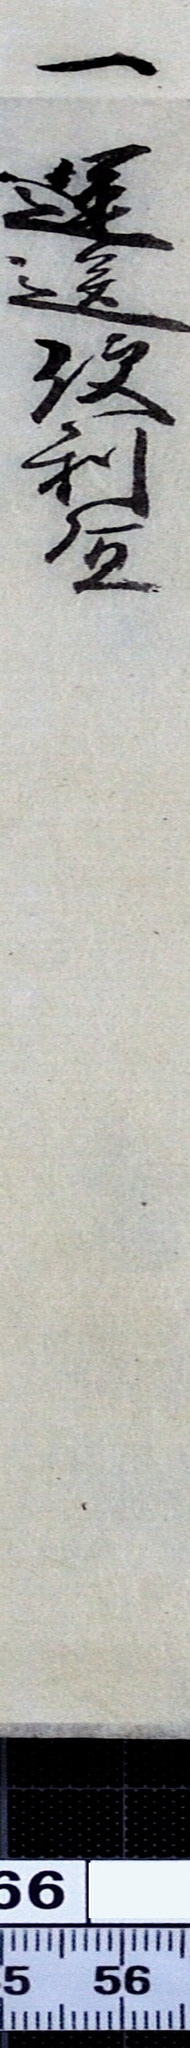一運送便利宜
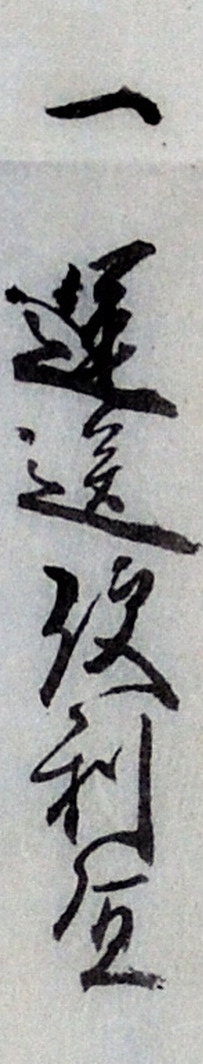一運送便利宜
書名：官林反別帳
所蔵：伊那市立高遠町図書館・合同会社AMANE
